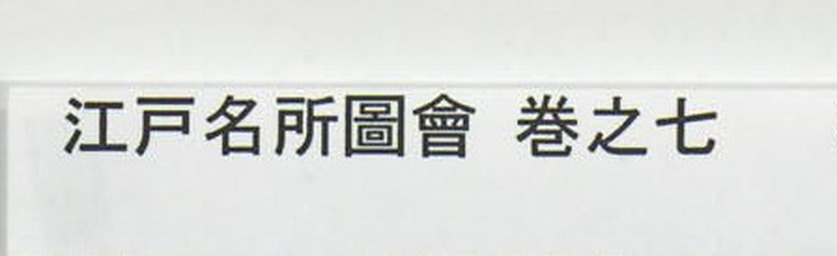江戸名所図会巻之三
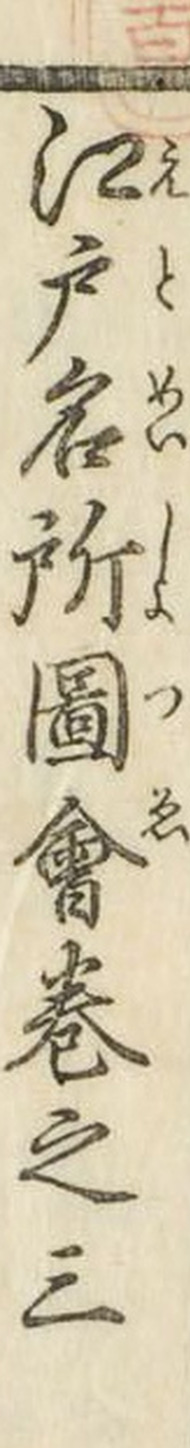江戸名所図会巻之三
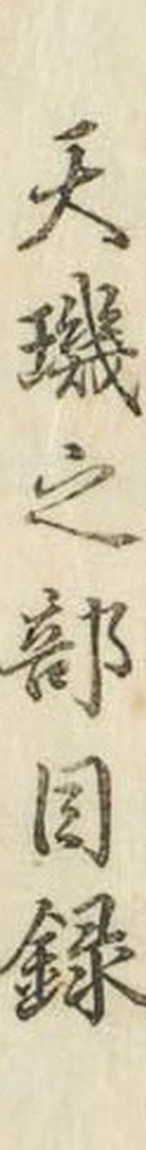天璣之部目録

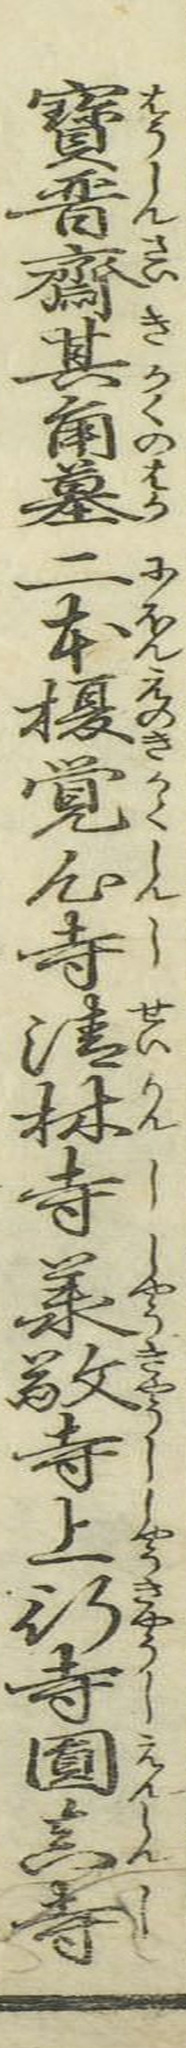宝晋斎其角墓二本榎覚心寺清林寺承敬寺上行寺円真寺

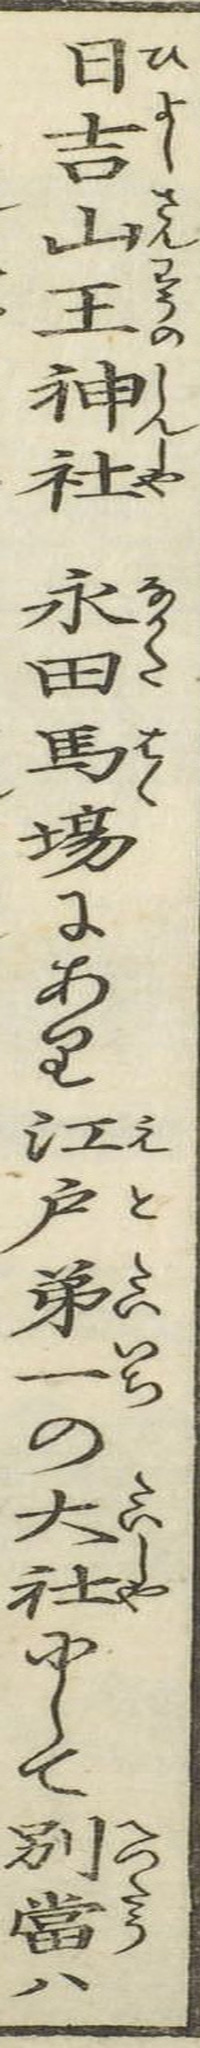日吉山王神社永田馬塲にあり江戸第一の大社にして別當は
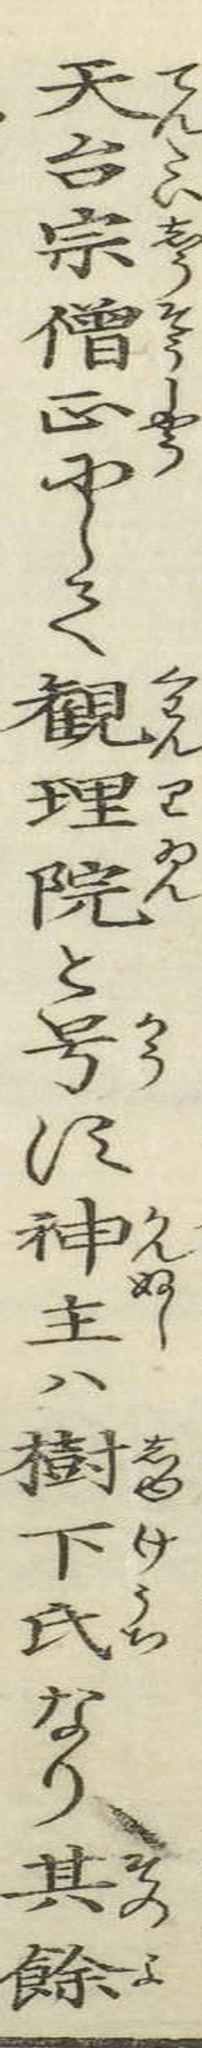天台宗僧正にして観理院と号す神主は樹下氏なり其餘
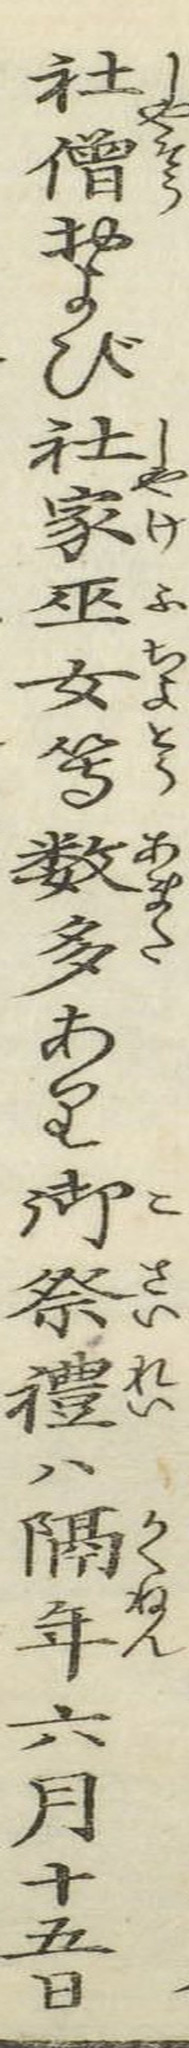社僧および社家巫女等数多あり御祭禮は隔年六月十五日
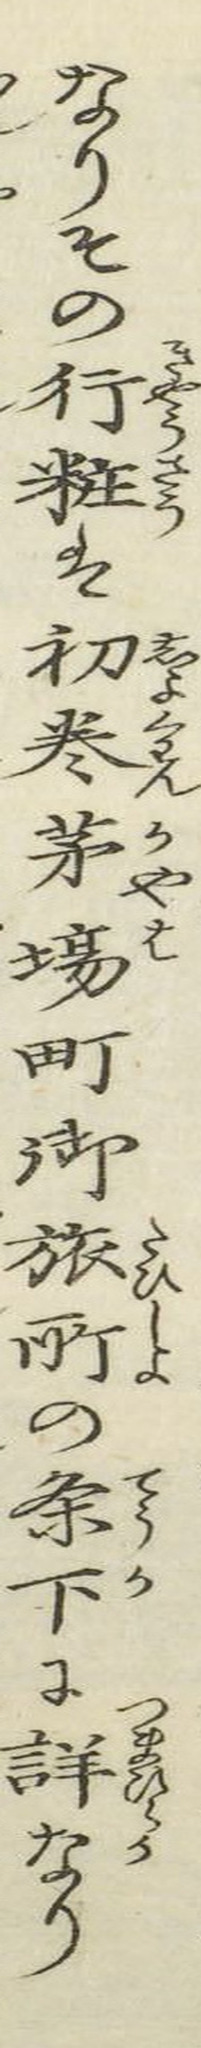なりその行粧は初巻茅塲町御旅所の条下に詳なり
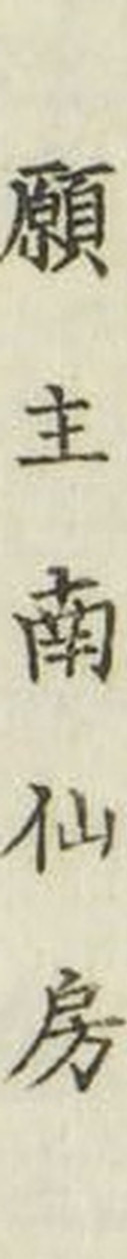願主南仙房
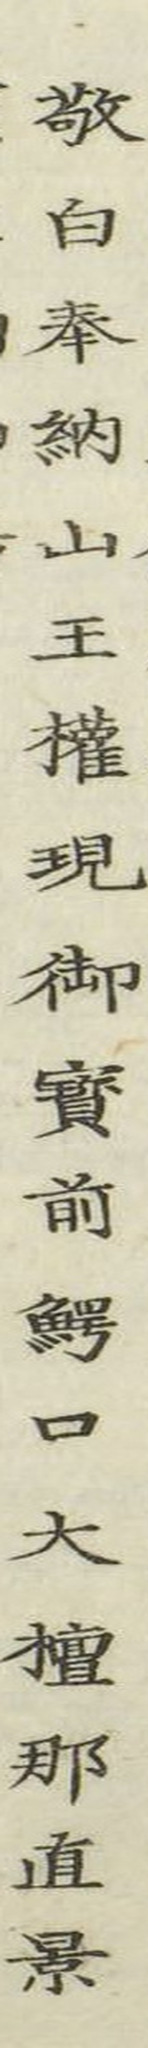敬白奉納山王權現御寳前鰐口大檀那直景
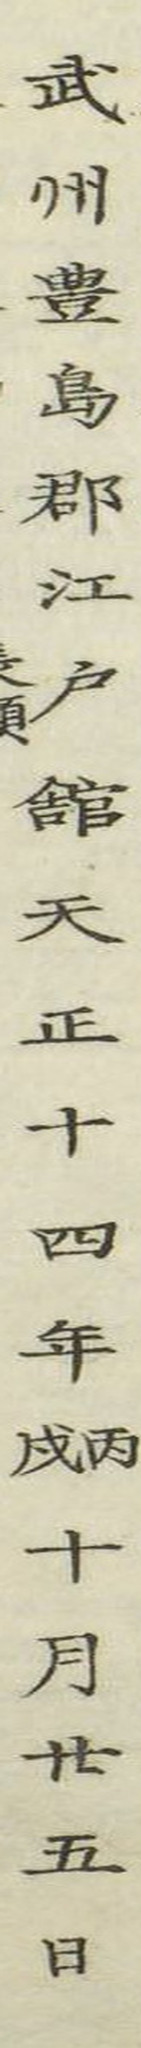武州豊島郡江戸舘天正十四年丙戌十月廿五日
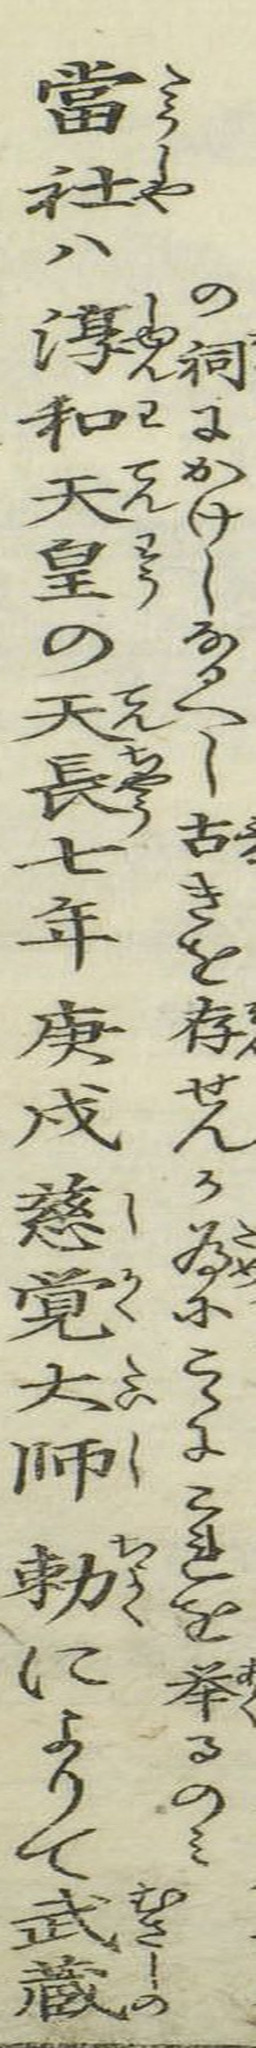當社は淳和天皇の天長七年庚戌慈覚大師勅によりて武蔵
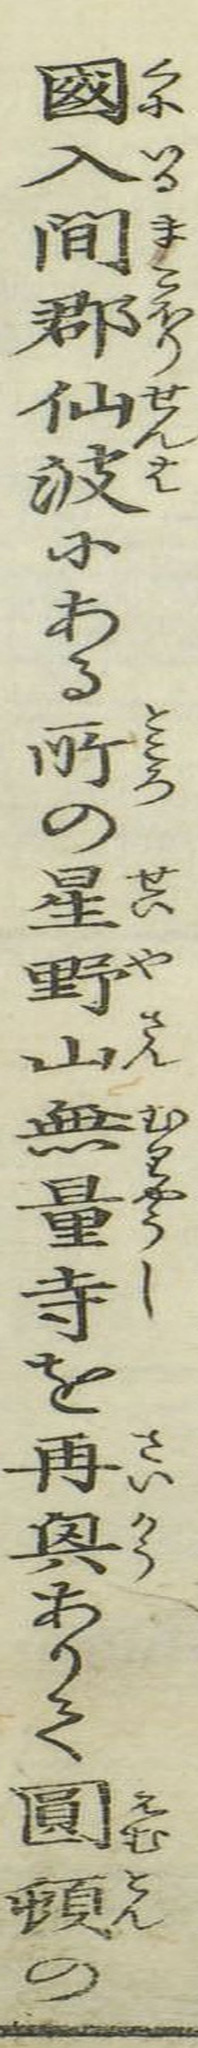國入間郡仙波にある所の星野山無量寺を再興ありて圓頓の

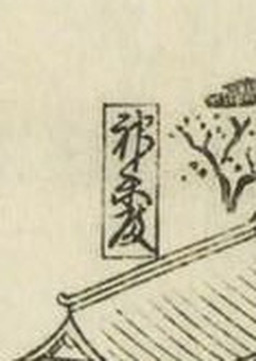神楽殿

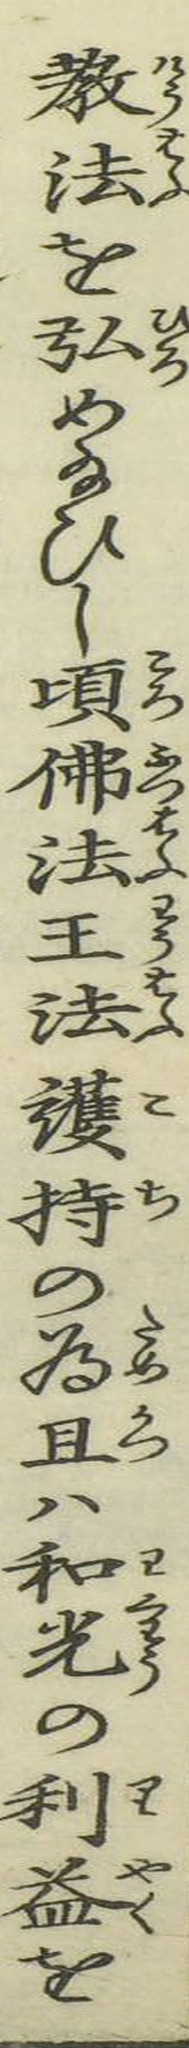教法を弘め給ひし頃佛法王法護持の為且は和光の利益を
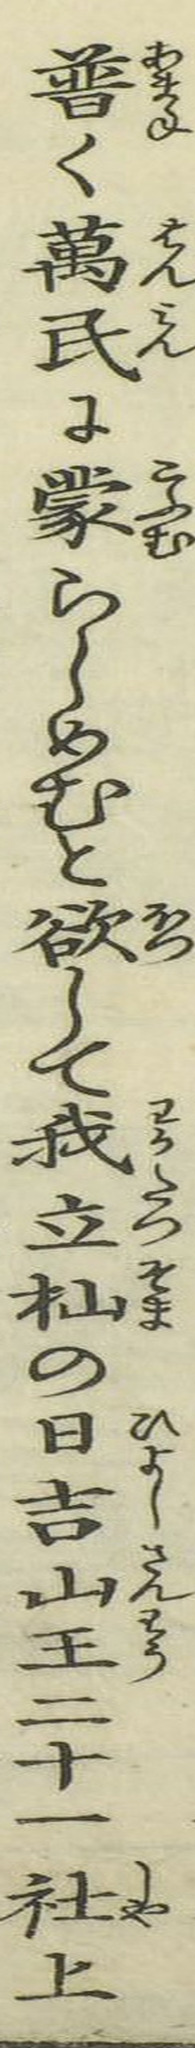普く萬民に蒙らしめむと欲して我立杣の日吉山王二十一社上
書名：江戸名所図会 20巻 巻之7
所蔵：東京学芸大学教育コンテンツアーカイブ
